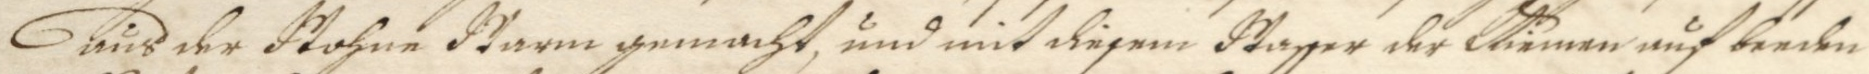aus der Wohne Warm gemacht, und mit diesem Wasser der Riemen auf beeden
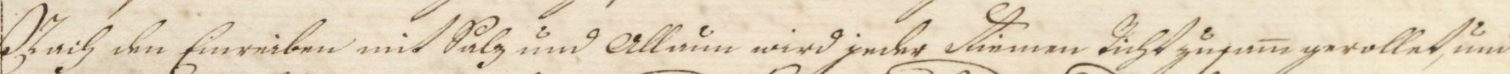Nach den Einreiben mit Salz und Allaun wird jeder Riemen Ticht zusamm gerollet, um
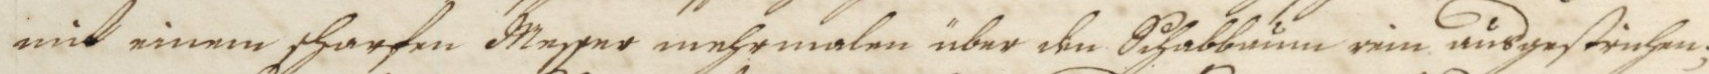mit einem scharfen Messer mehrmalen über den Schabbaum rein ausgestrichen;
